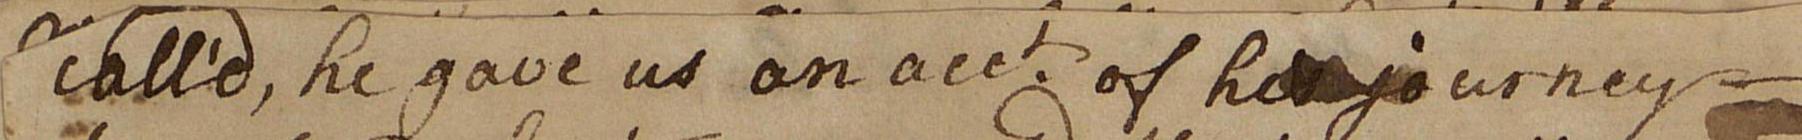call'd, he gave us an acc^t. of his journeys
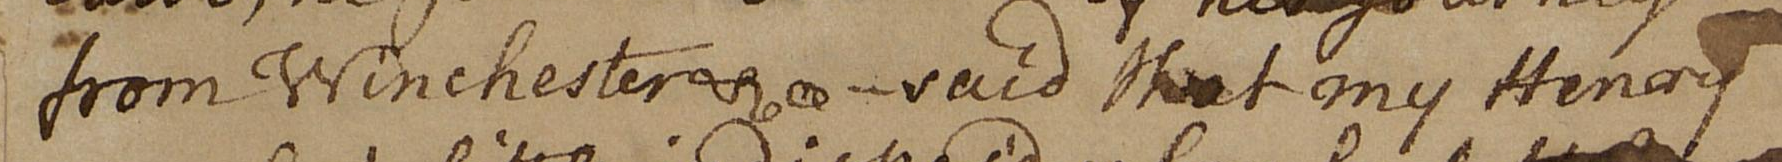from Winchester &c -said that my Henry
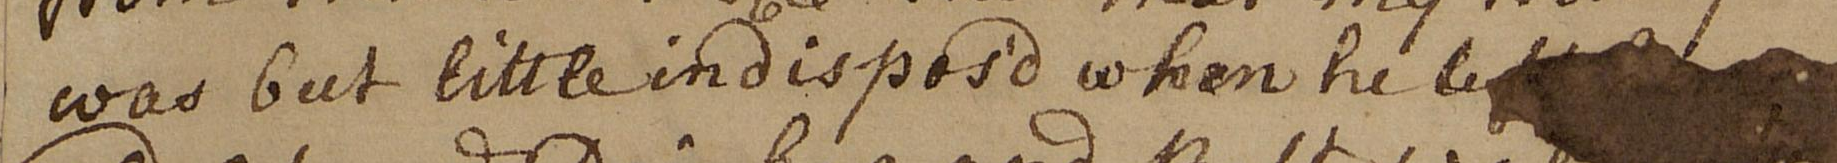was but little indispos'd when he left for
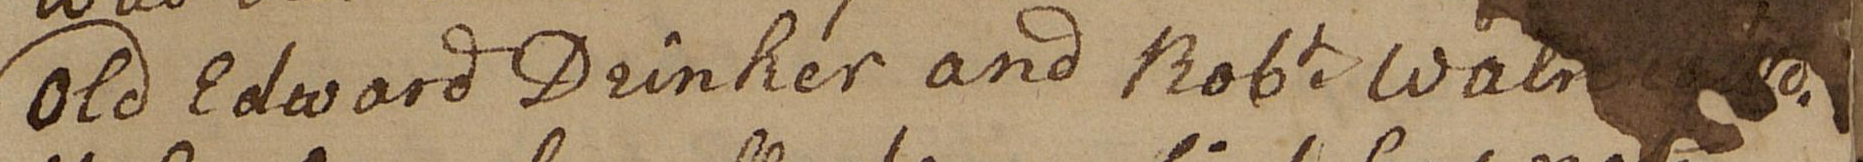old Edward Drinker and Rob^t Waln [___]o.
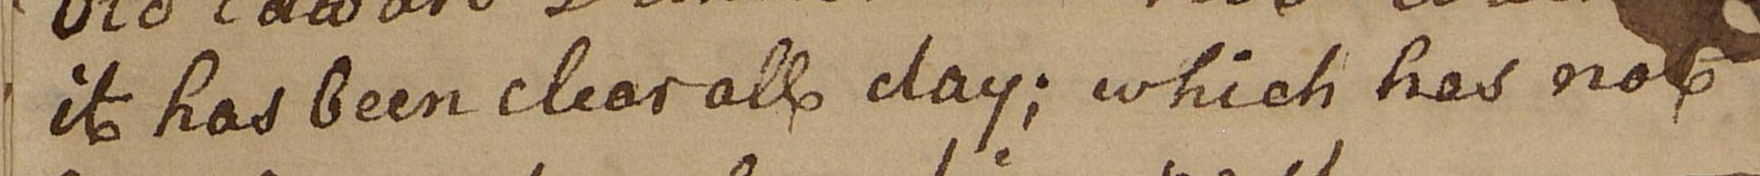it has been clear all day; which has not
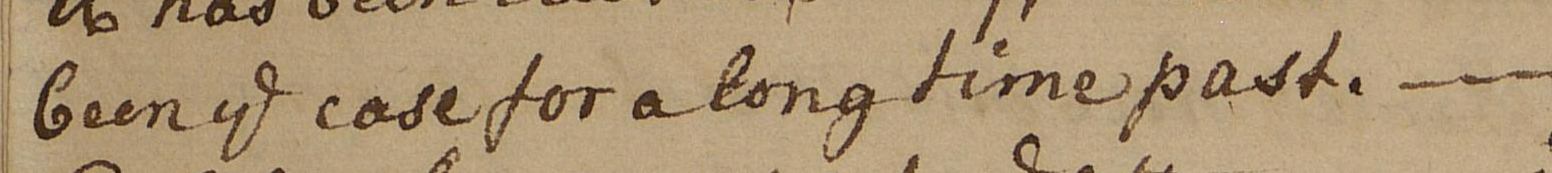been y^e case for a long time past.-
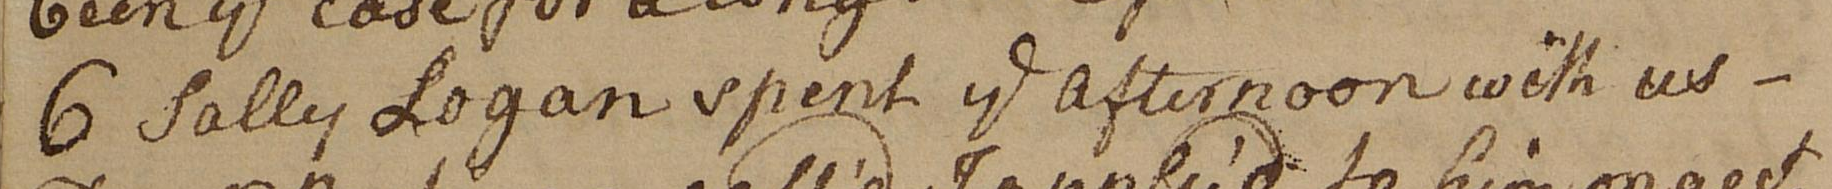6 Sally Logan spent y^e afternoon with us-
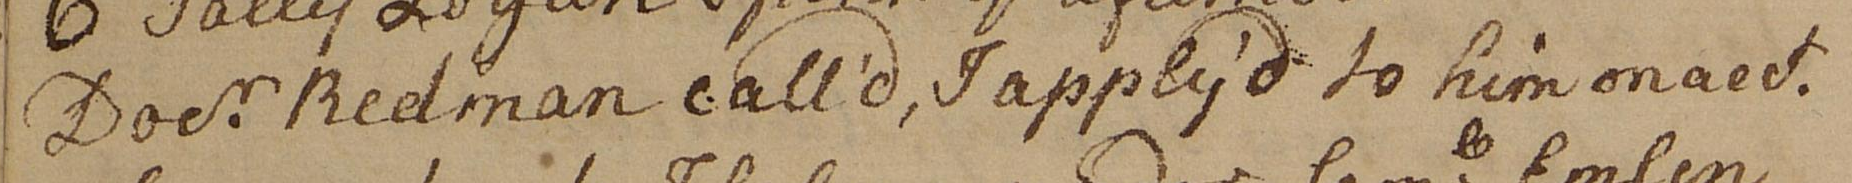Doc^r. Redman call'd, I apply'd to him on acc^t.
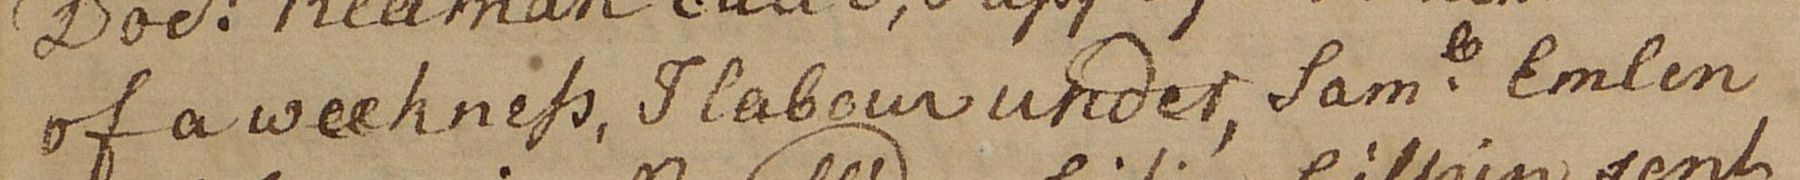of a weekness, I labour under, Sam^l. Emlen
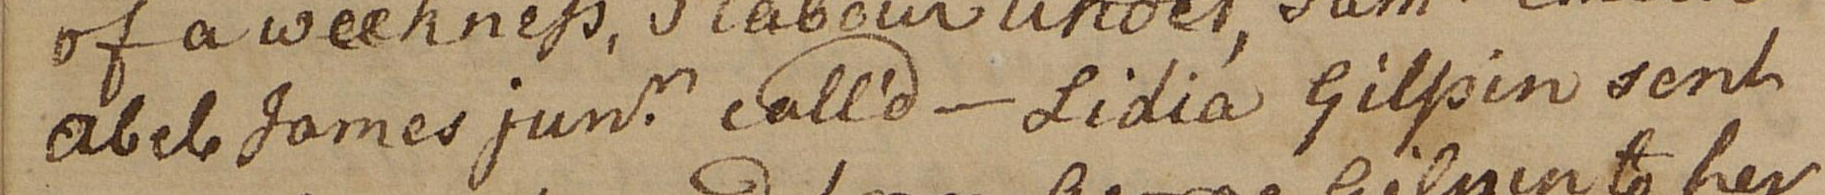Abel James jun^r. call'd- Lidia Gilpin sent
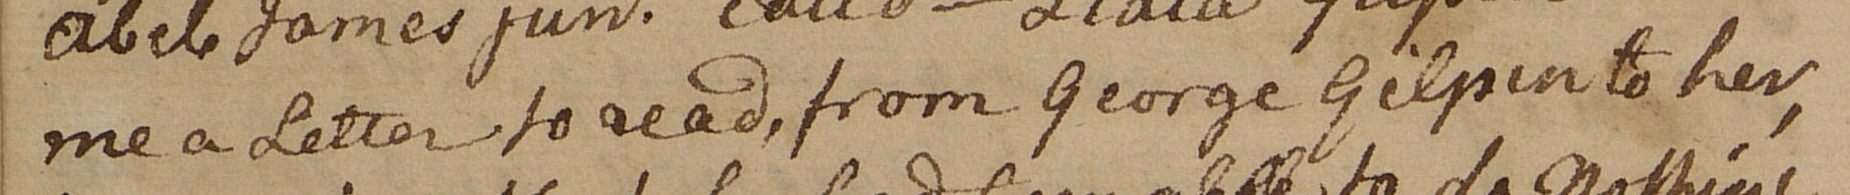me a Letter to read, from George Gilpin to her,
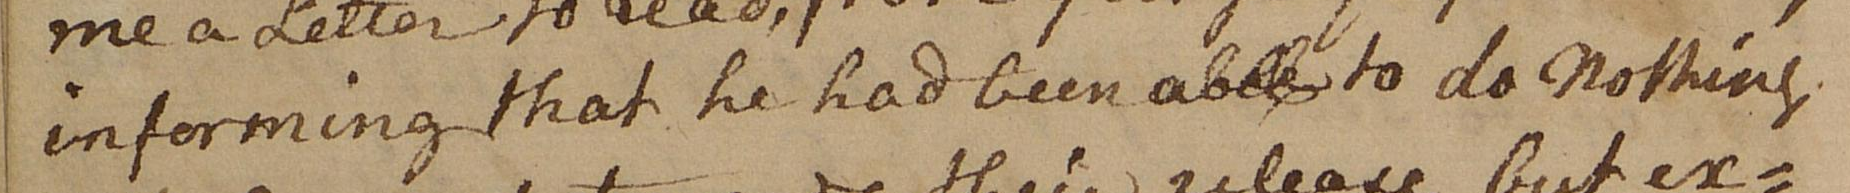informing that he had been able to do Nothing
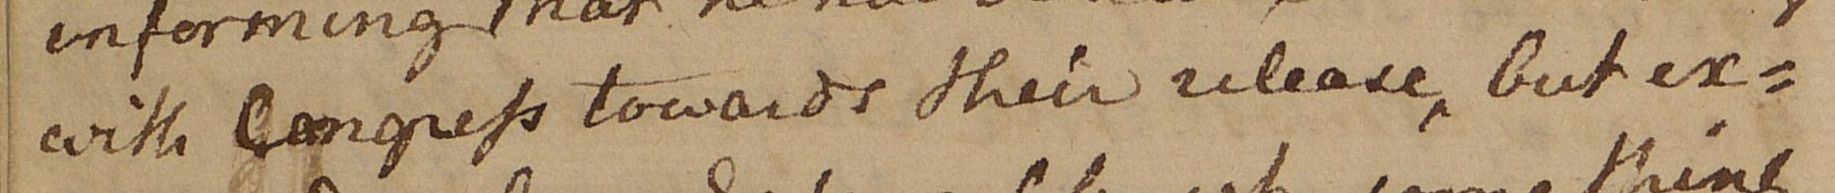with Congress towards their release, but ex-
